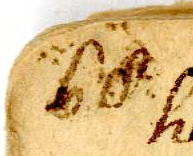68
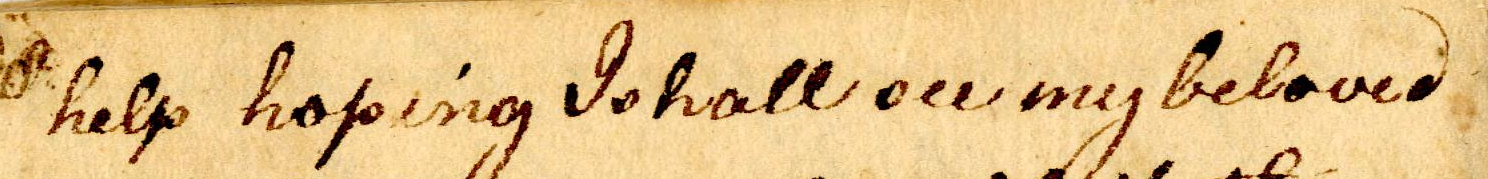help hoping I shall see my beloved
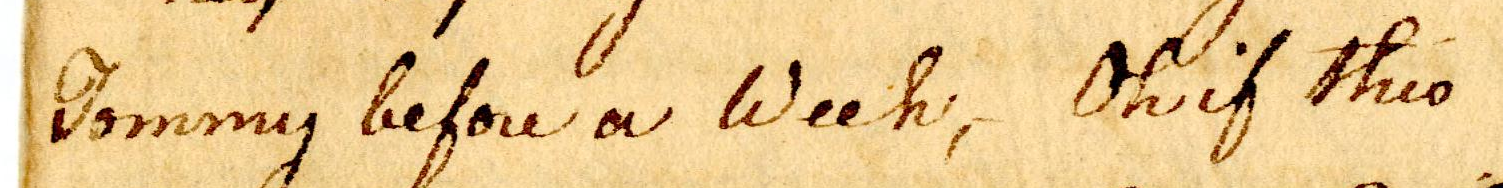Tommy before a Week- Oh if this
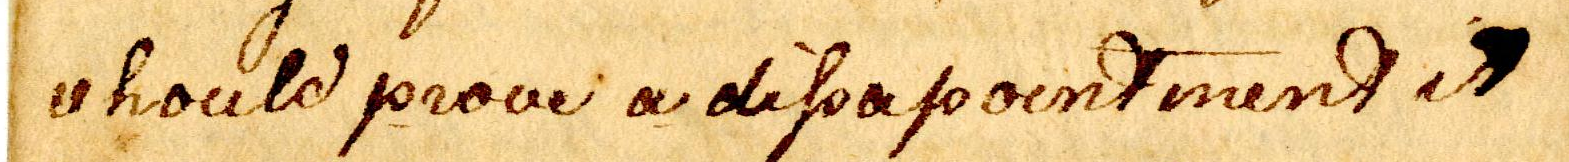should prove a dissapointment it
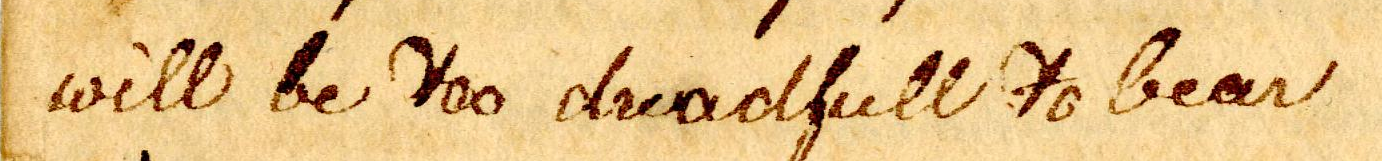will be too dreadfull to bear
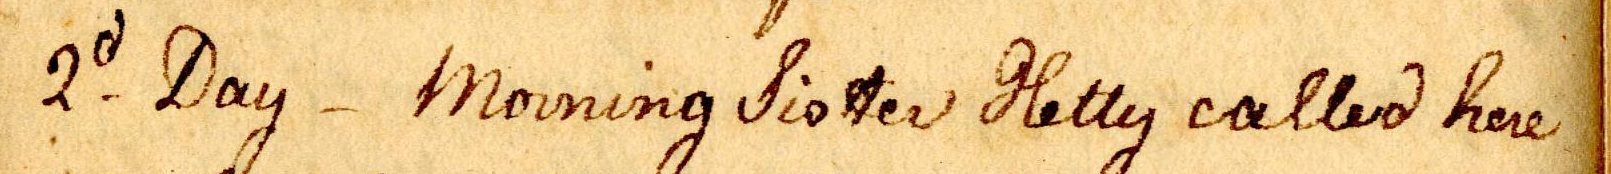2^d Day- Morning Sister Hetty called here
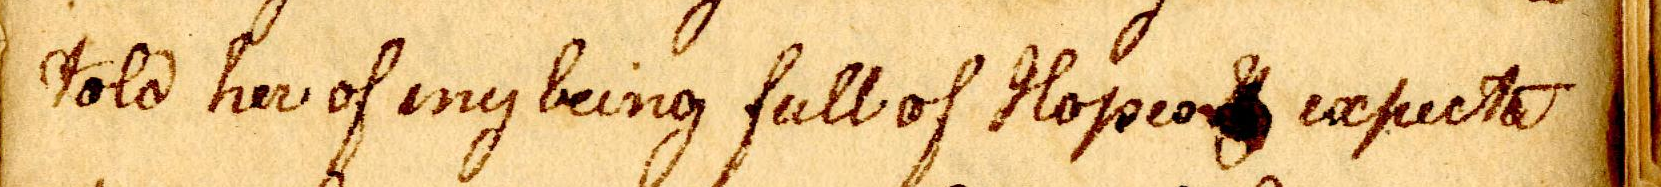told her of my being full of Hopes & expecta
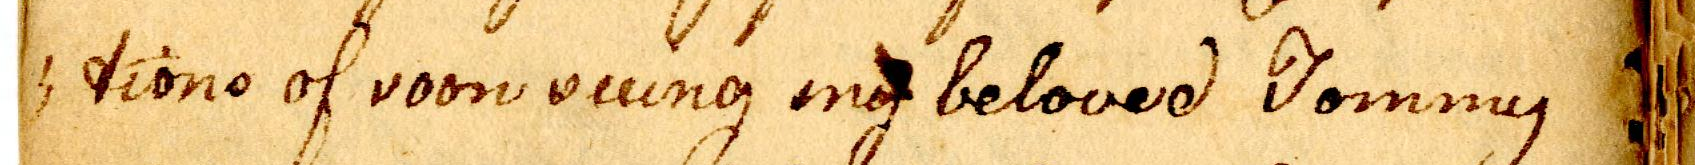-tions of soon seeing my beloved Tommy
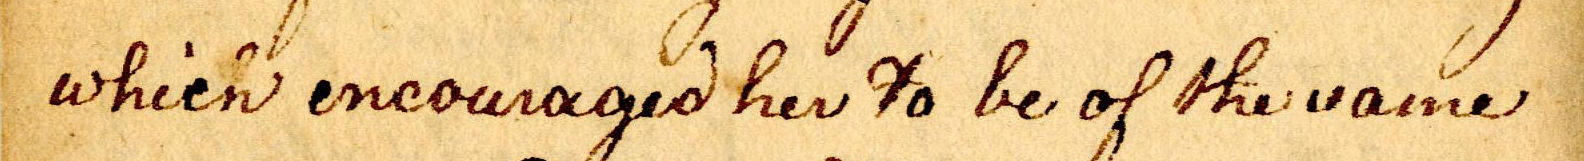which encouraged her to be of the same
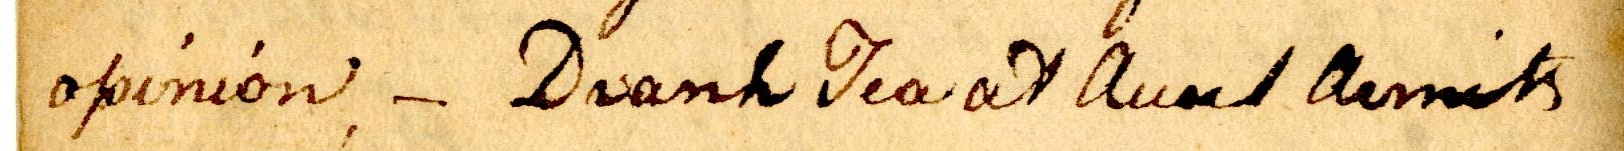opinion- Drank Tea at Aunt Armits
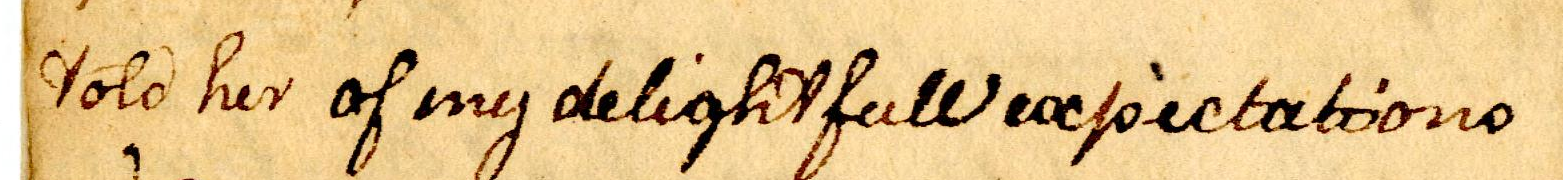told her of my delightfull expectations
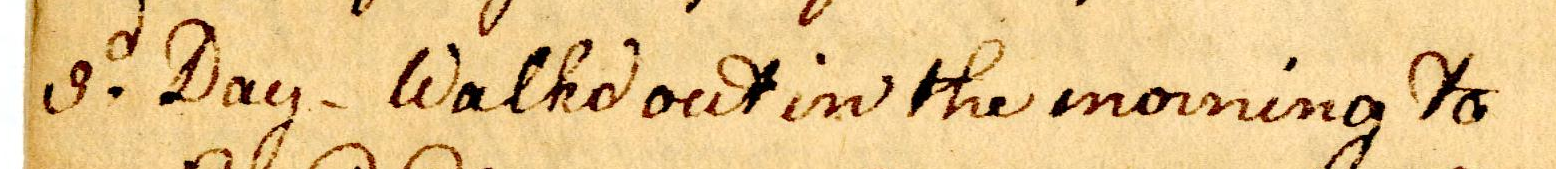3^d. Day- Walkd out in the morning to
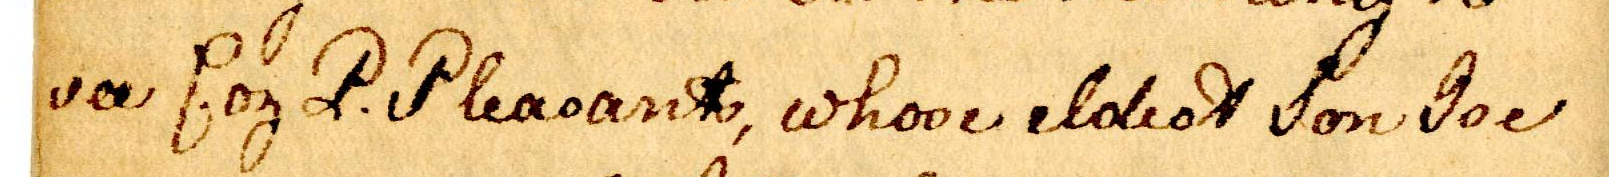see Coz P. Pleasants, whose eldest Son Ise
